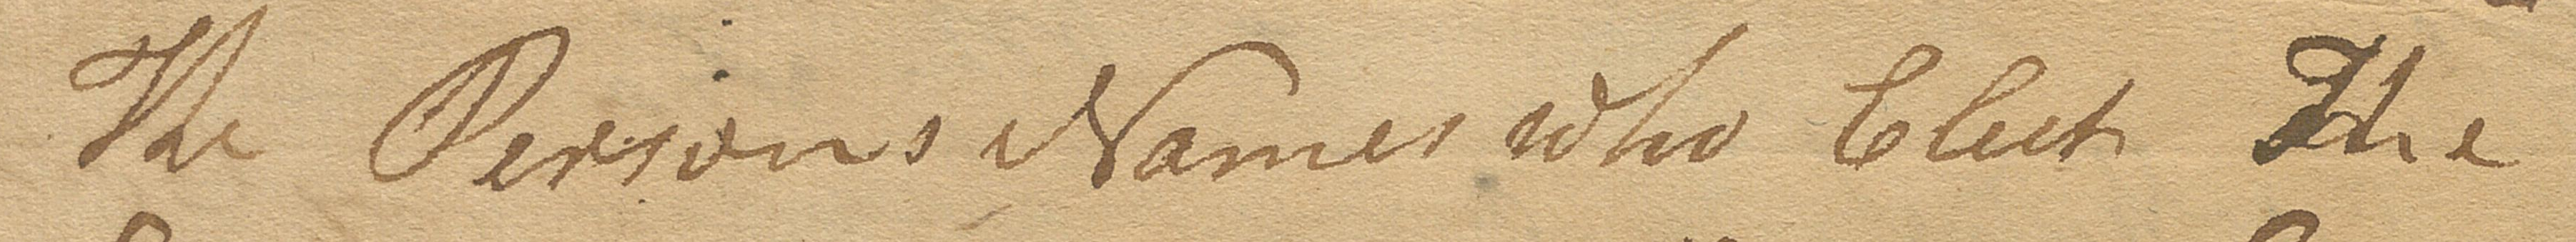The Persons Names who Elect The
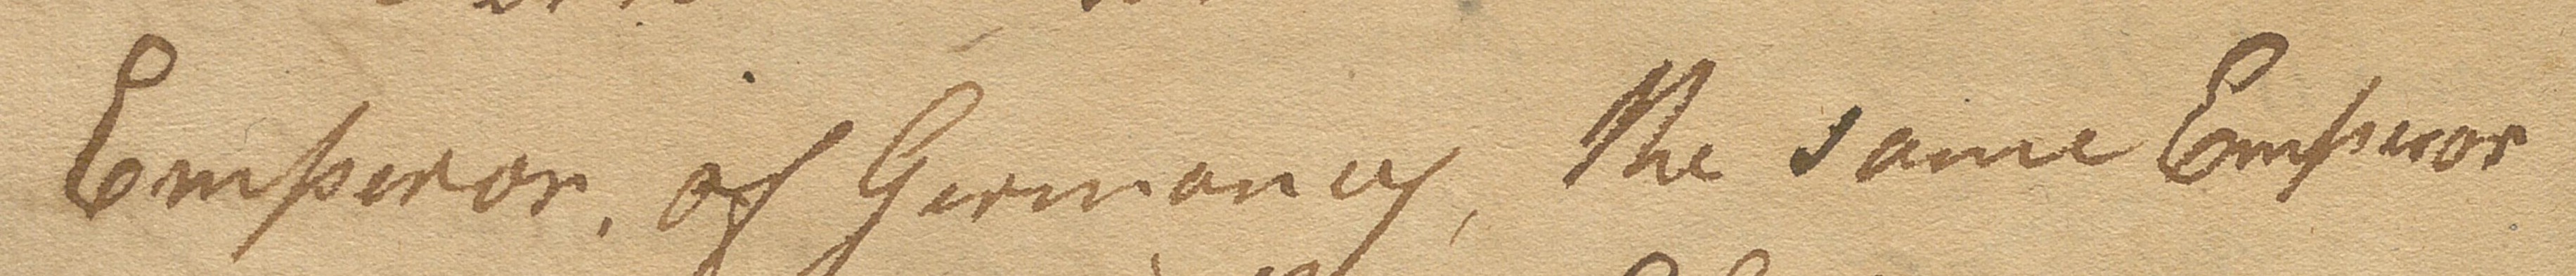Emperor, of Germaney the same Emperor
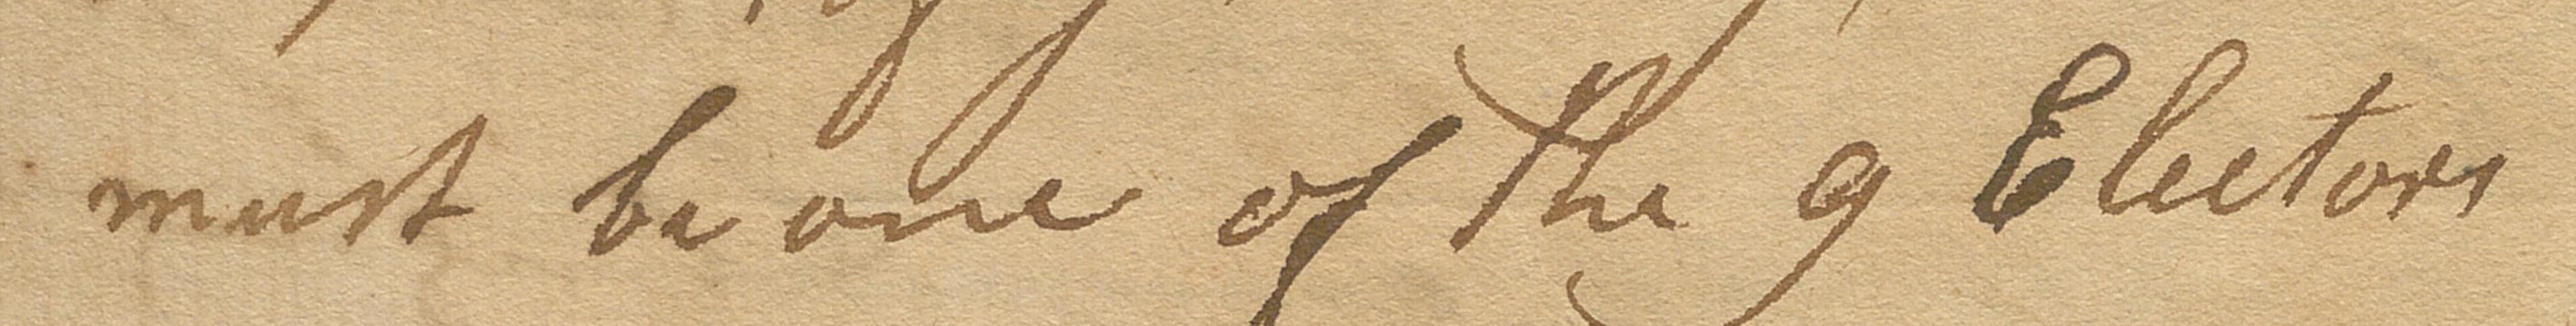must be one of the 9th Electors
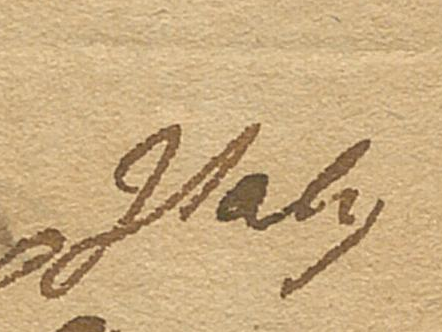Italy
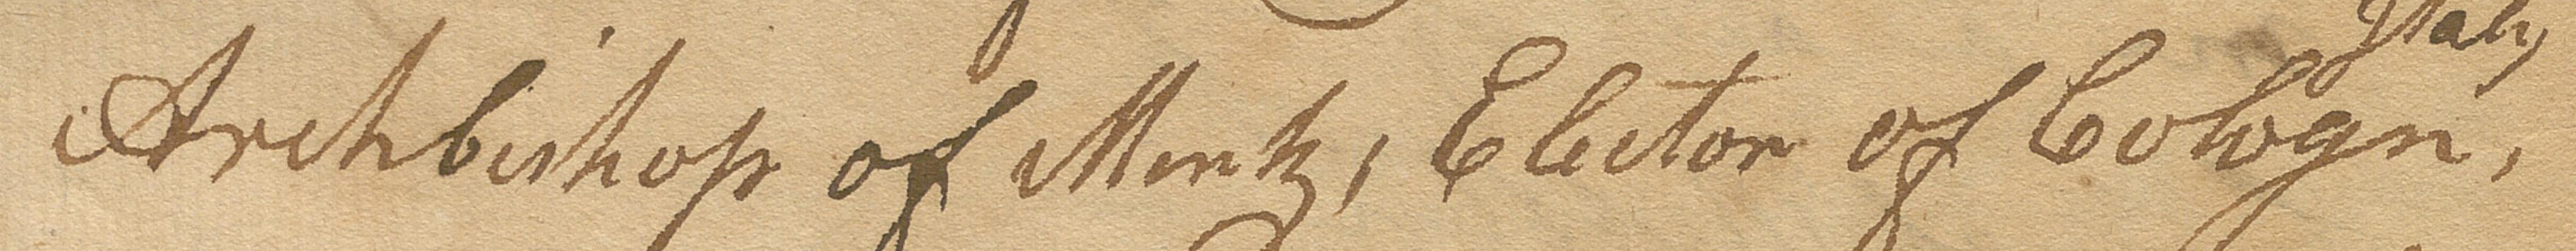Archbishop of Mentz, Elector of Cologn,
